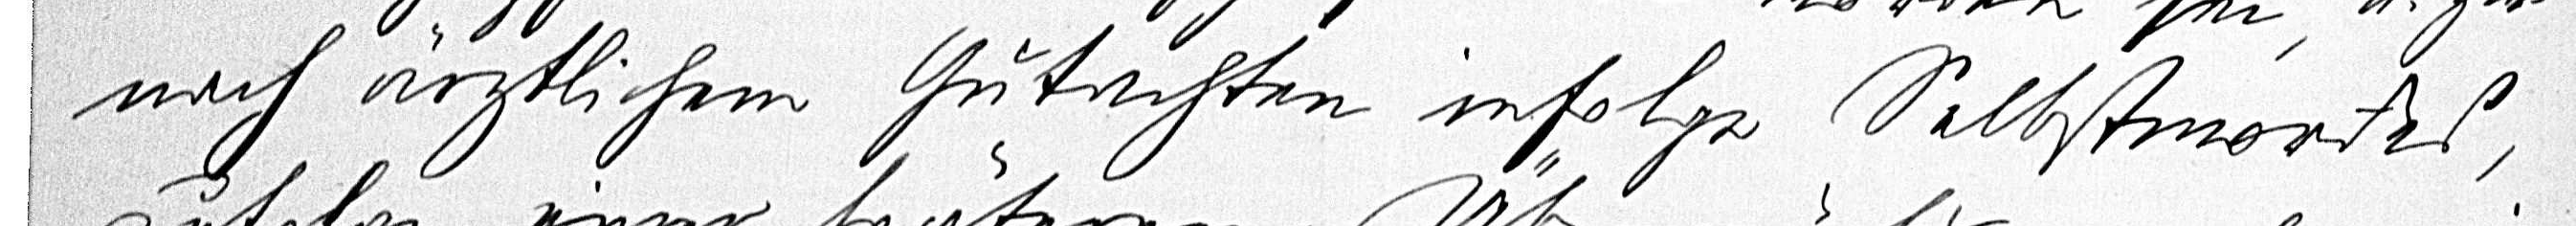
nach ärztlichen Gutachten infolge Selbstmordes,
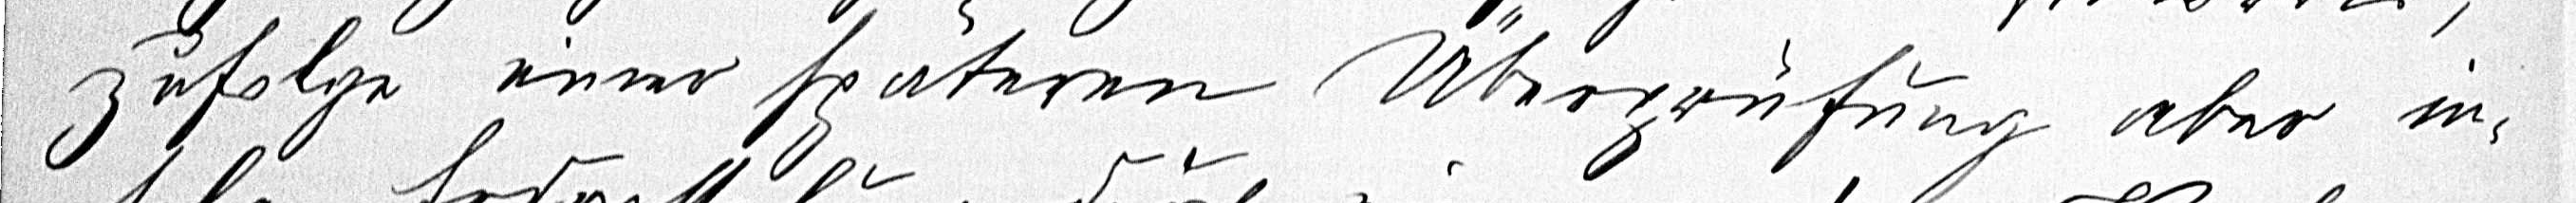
zufolge einer späteren Überprüfung aber in¬
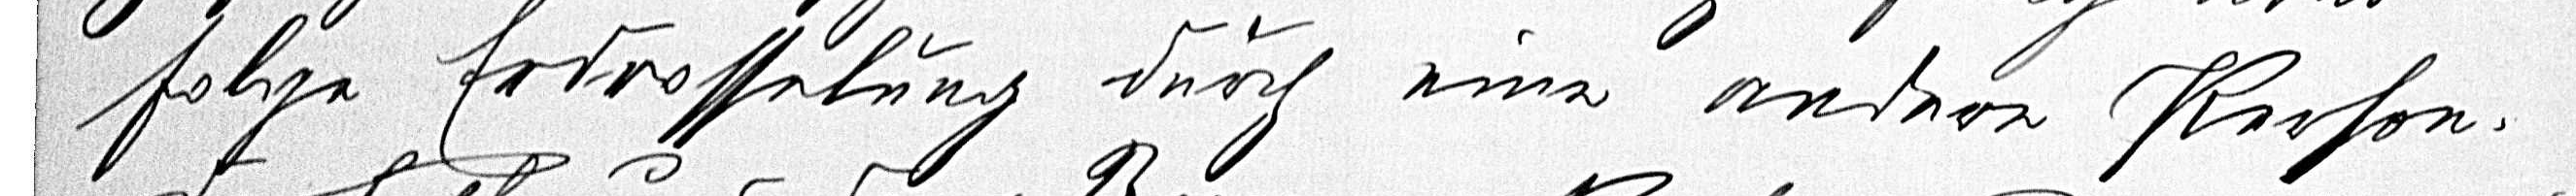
folge Erdrosselung durch eine andere Person.
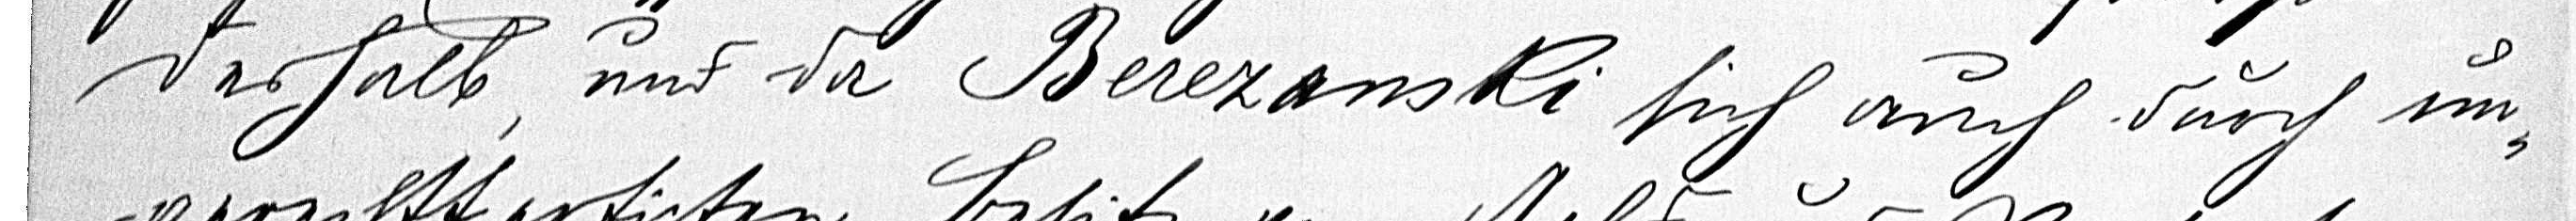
Deshalb, und da Berezanski sich auch durch un¬
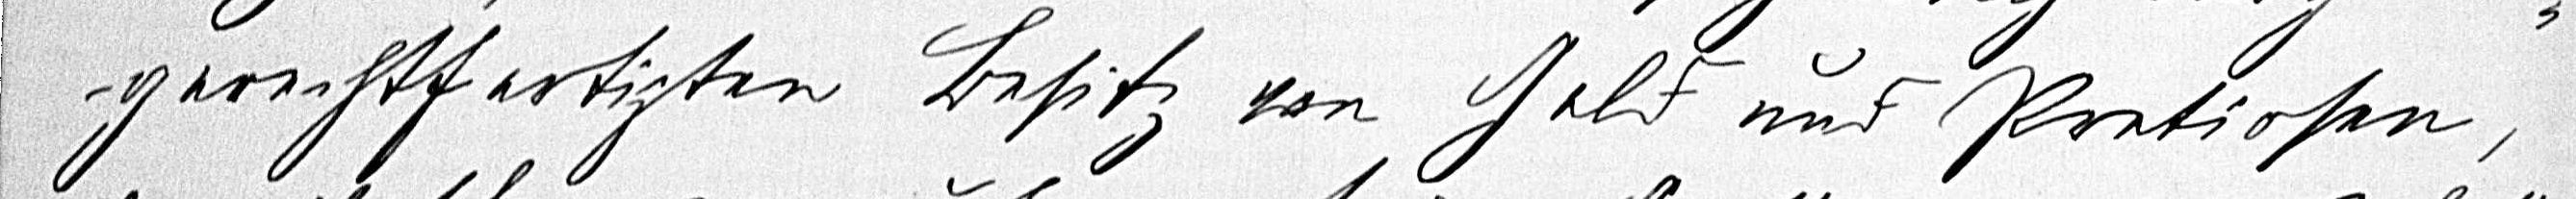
gerechtfertigten Besitz von Geld und Pretiosen,
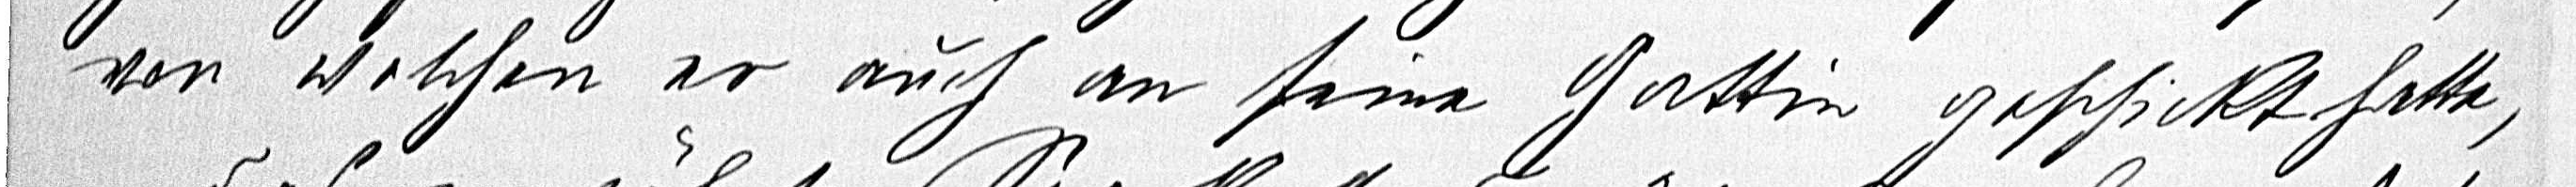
von welchen er auch an seine Gattin geschickt hatte,
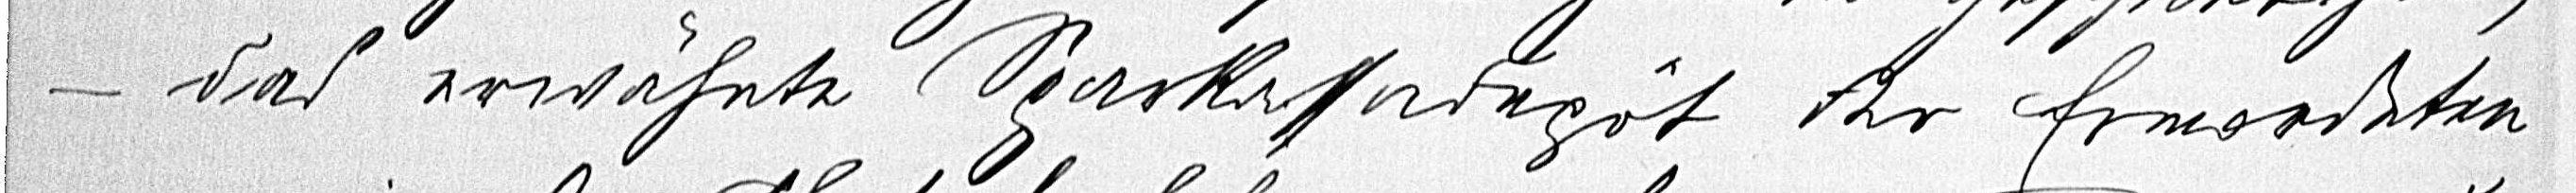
– das erwähnten Sparkassadepot der Ermordeten
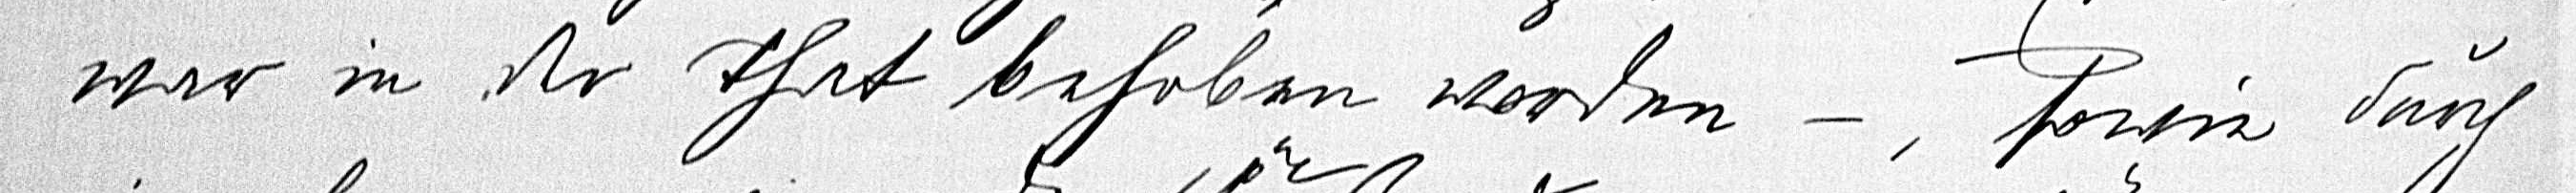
war in der That behoben worden – sowie durch
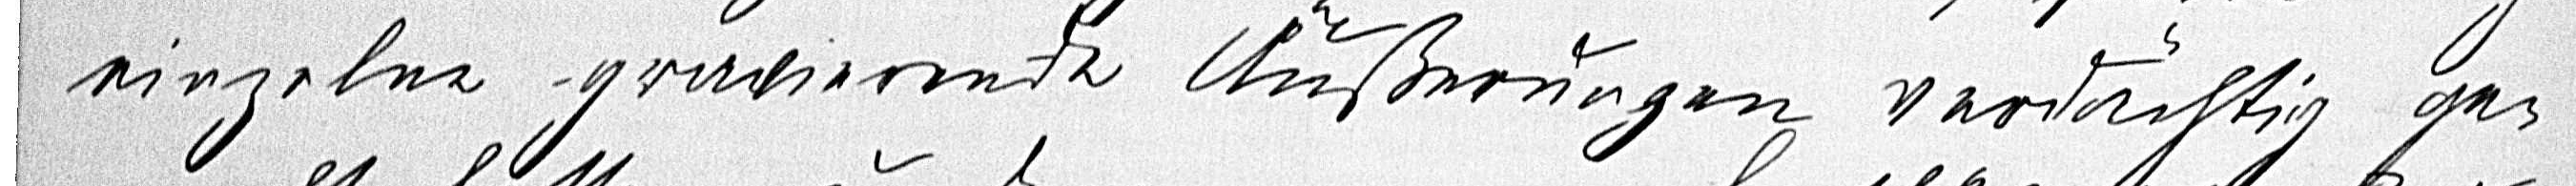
einzelne gravierende Äußerungen verdächtig ge¬
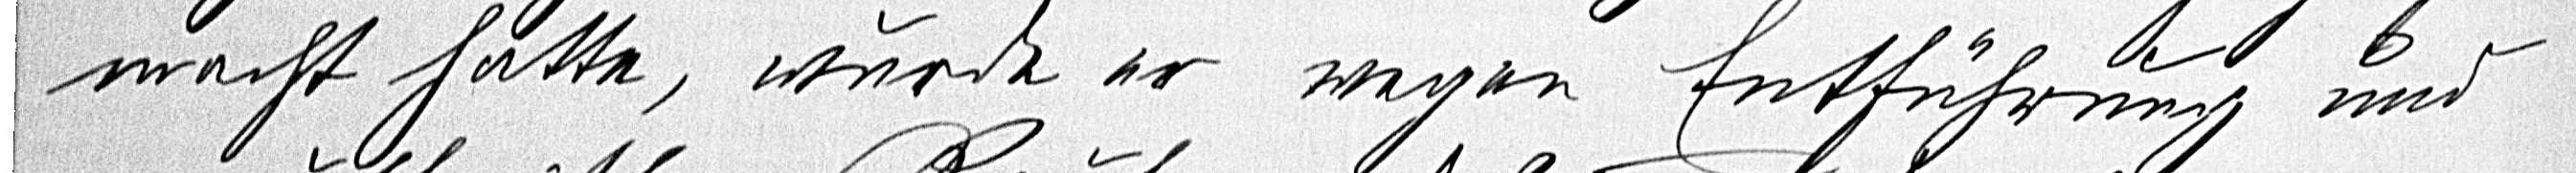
macht hatte, wurde er wegen Entführung und
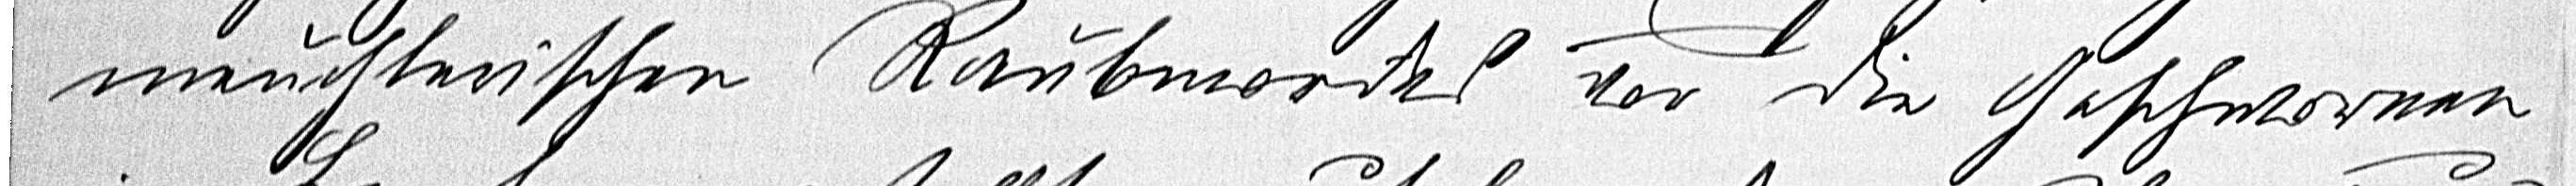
meuchlerischen Raubmordes vor die Geschworenen
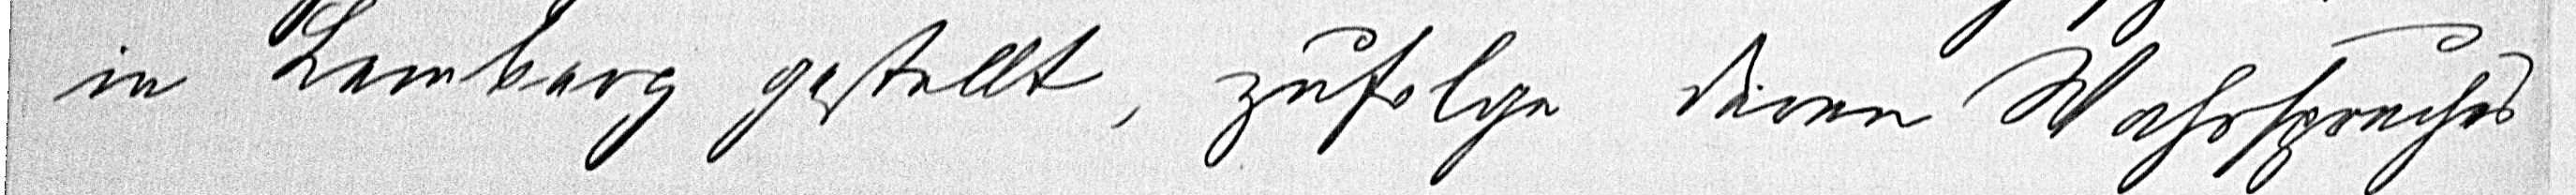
in Lemberg gestellt, zufolge deren Wahrspruches
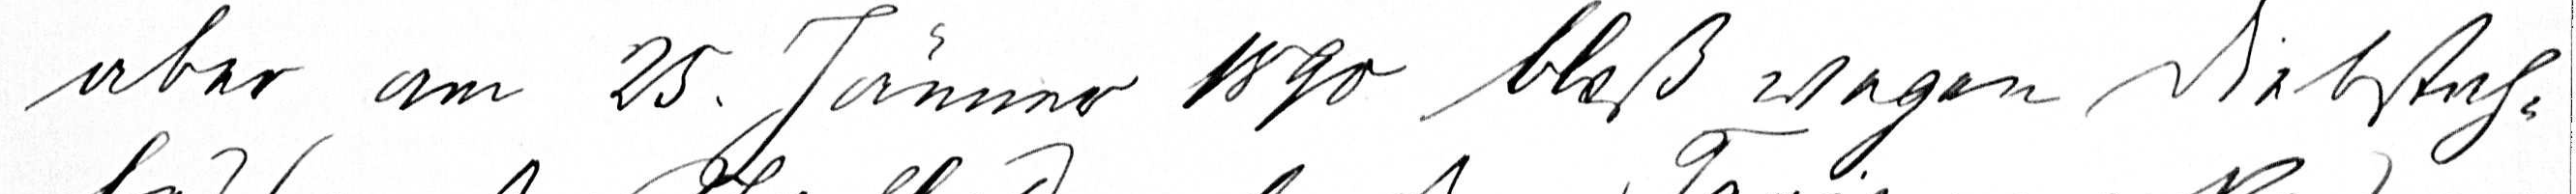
aber am 25. Jänner 1890 bloß wegen Diebstah¬
